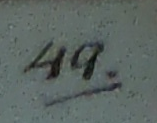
49.
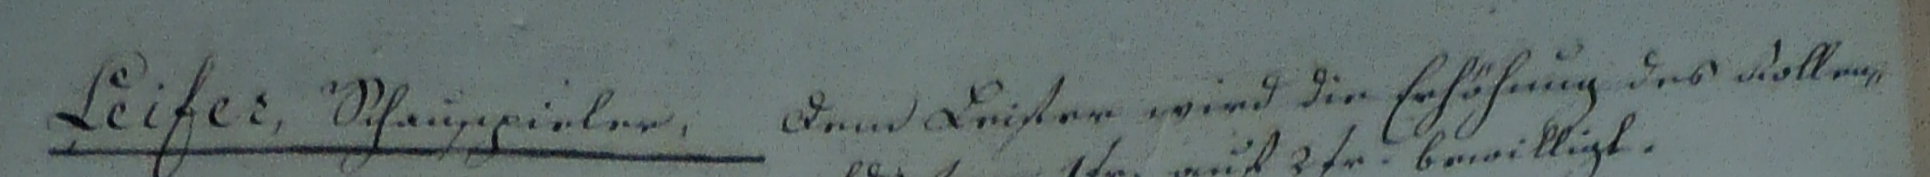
Leifer, Schauspieler, Dem Leifer wird die Erhöhung des Rollen¬
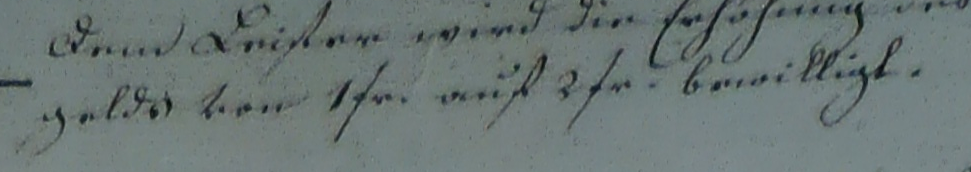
gelds von 1fr. auf 2fr. bewilligt.
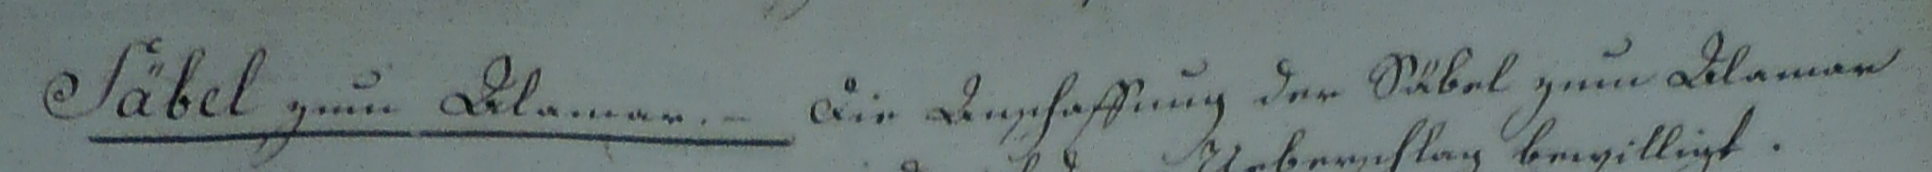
Säbel zum Alamar. — Die Anschaffung der Säbel zum Alamar
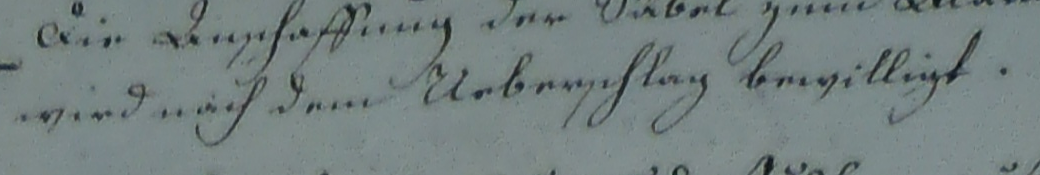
wird nach dem Ueberschlag bewilligt.
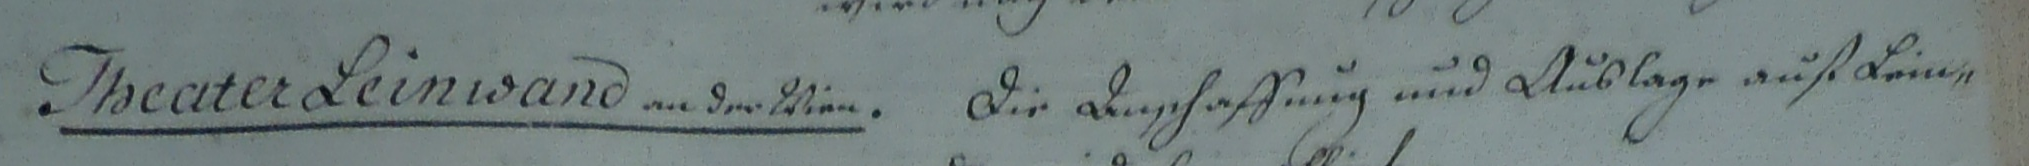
Theater Leinwand an der Wien. Die Anschaffung und Auslage auf Lein¬
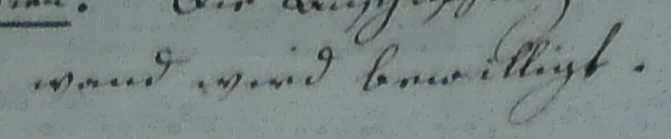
wand wird bewilligt.
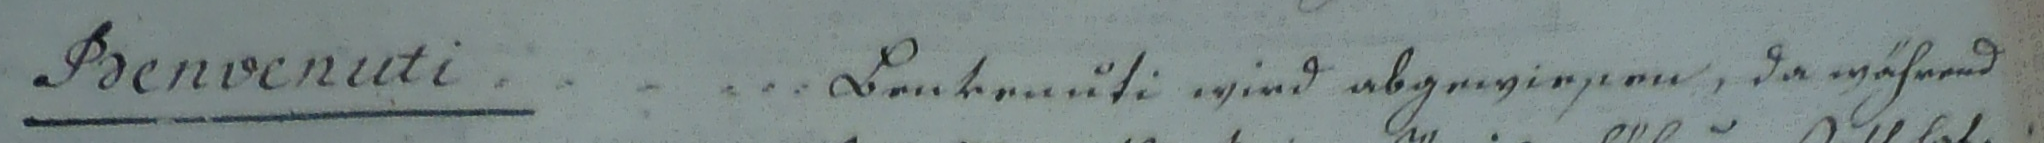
Benvenuti . . . … Benvenuti wird abgewiesen, da während
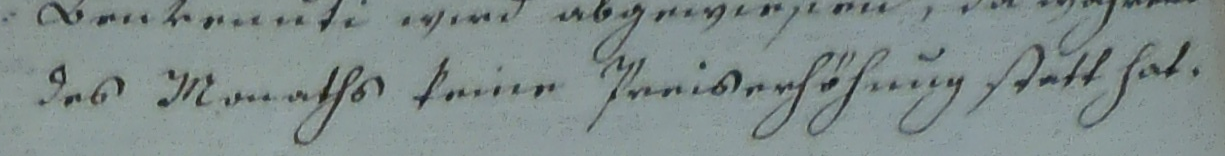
des Monaths keine Preiserhöhung statt hat.
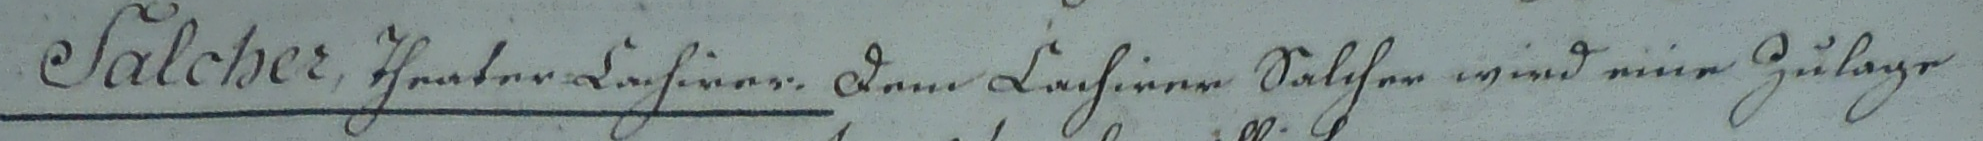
Salcher, Theater Lachirer. Dem Lachirer Salcher wird eine Zulage
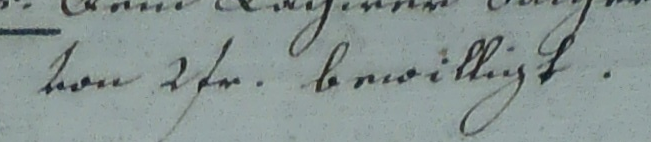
von 2fr. bewilligt.
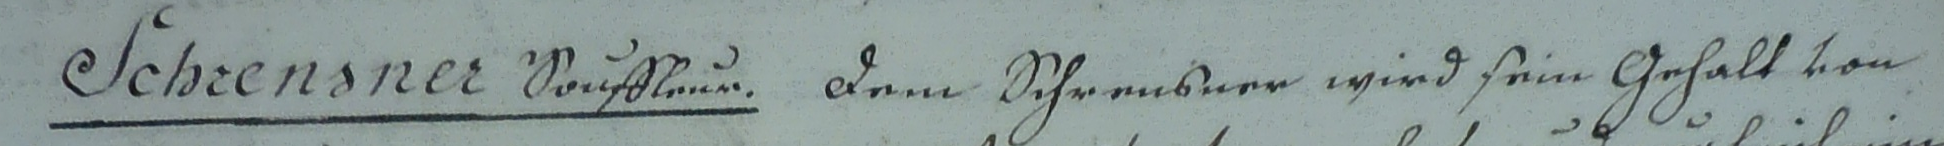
Schrensner Souffleur. Dem Schrenser wird sein Gehalt von
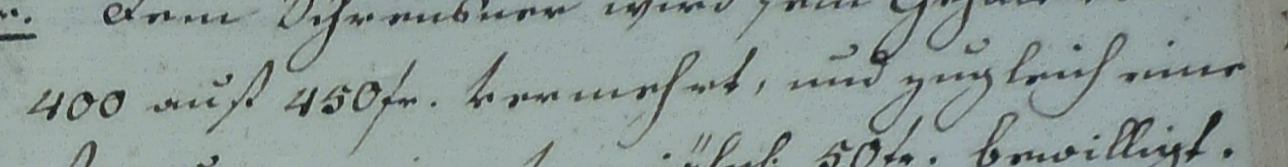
400 auf 450fr. vermehrt, und zugleich eine
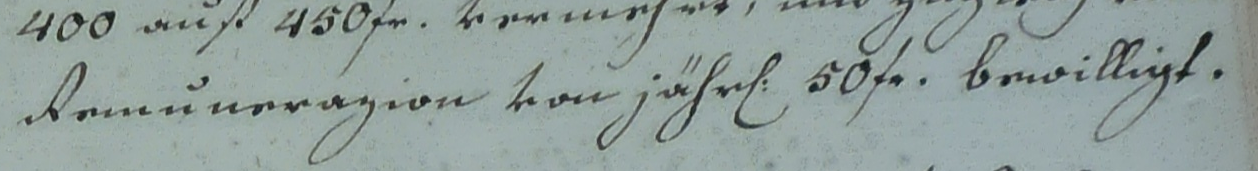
Remunerazion von jährE: 50fr. bewilligt.
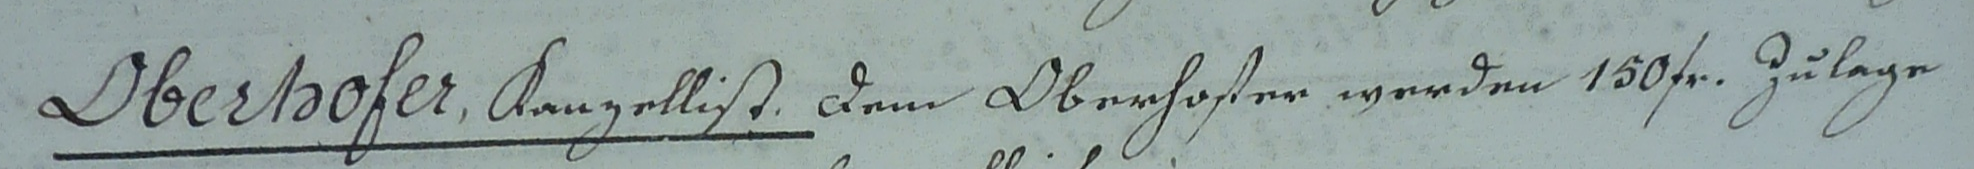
Oberhofer, Kanzellist. Dem Oberhofer werden 150fr. Zulage
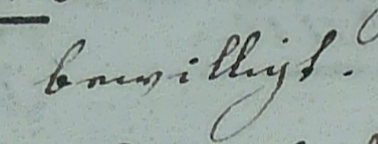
bewilligt.
